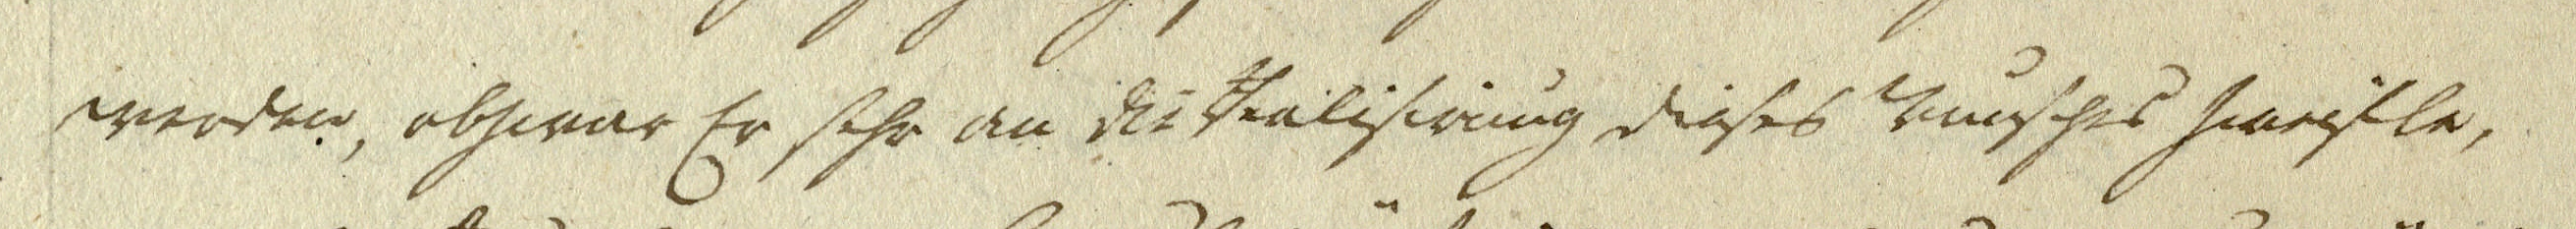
werden, obzwar Er sehr an die Realisirung dieses Wunsches zweifle,
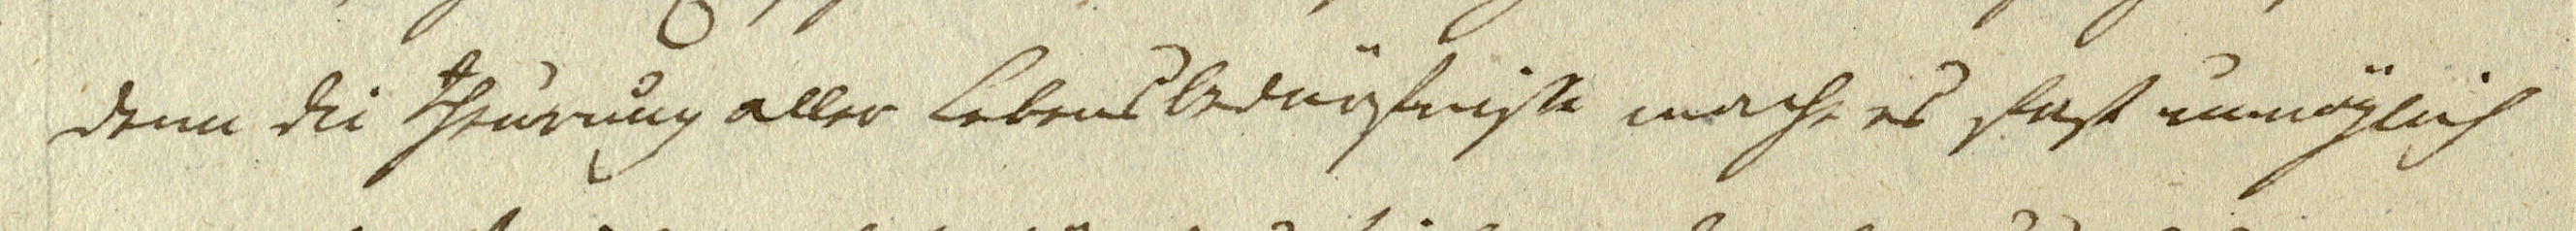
denn die Theurung aller Lebensbedürfnisse mache es fast unmöglich,
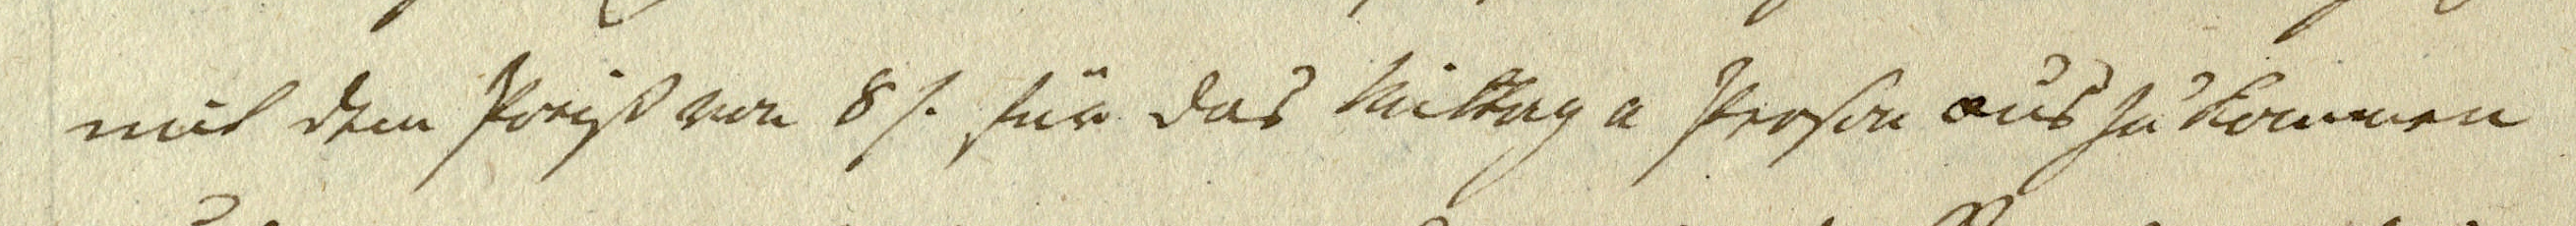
mit dem Preis von 8 s. für das Mittag a Person aus zu kommen
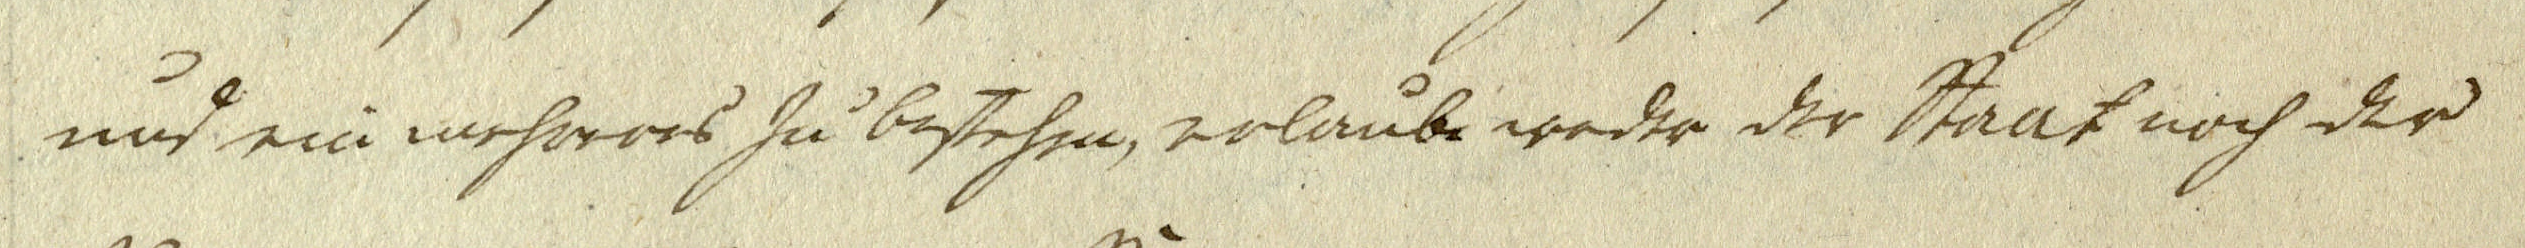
und ein mehreres zu bestehen, erlaube weder der Staat noch der
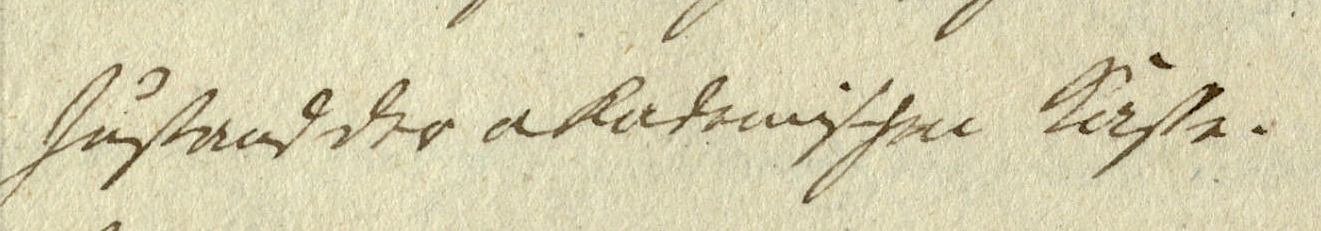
Zustand der akademischen Kasse.
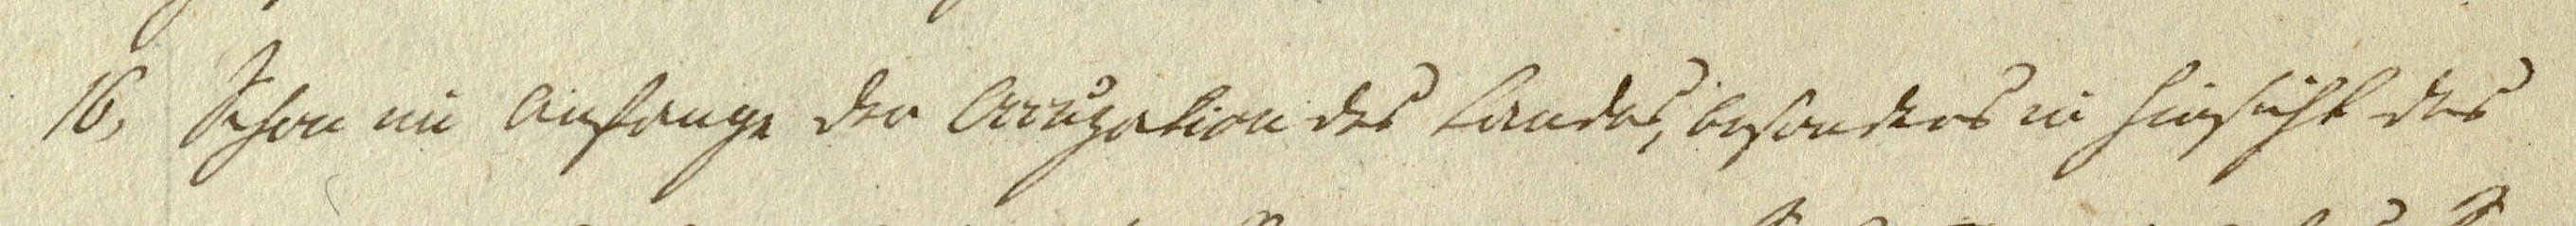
16, Schon im Anfange der Occupation des Landes, besonders in Hinsicht des
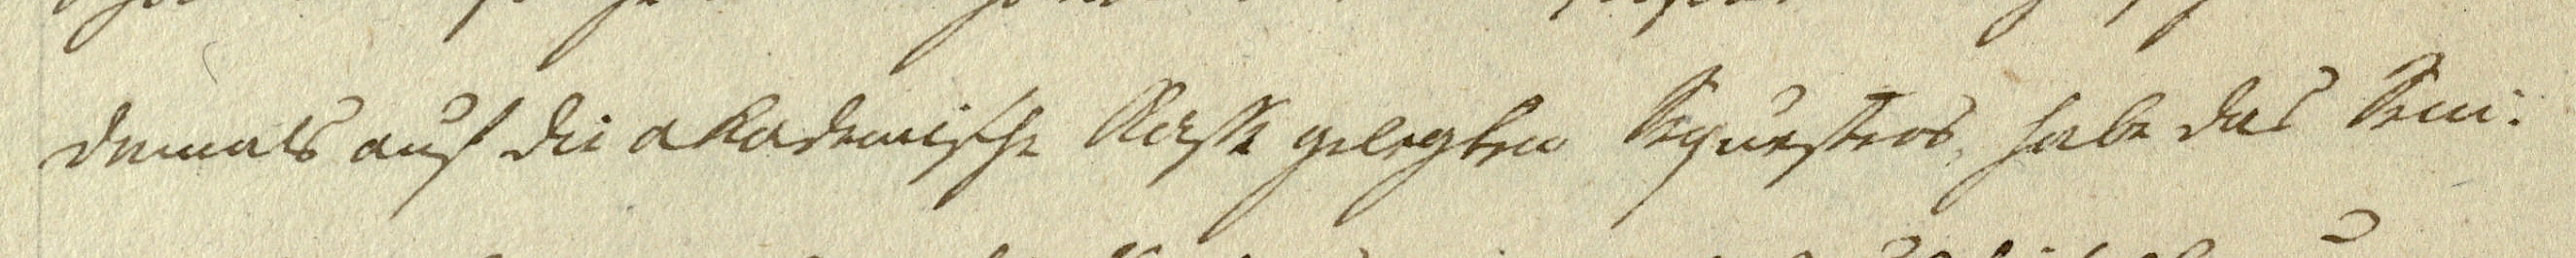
damals auf die akademische Kasse gelegen Sequesters, habe das Seni¬
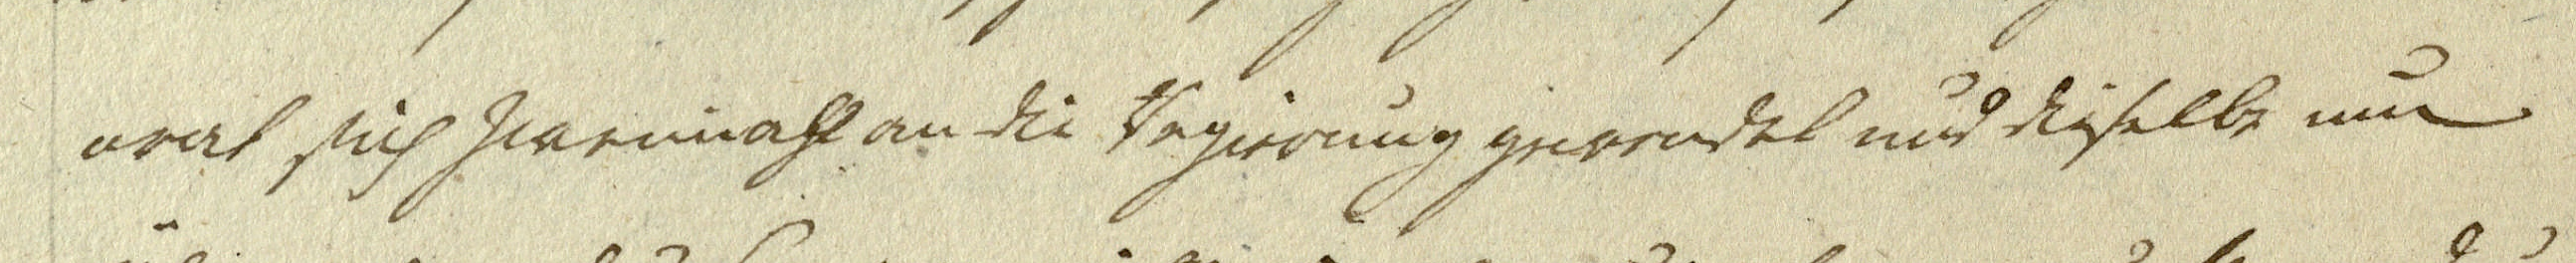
orat sich zweimahl an die Regierung gewendet und dieselbe um
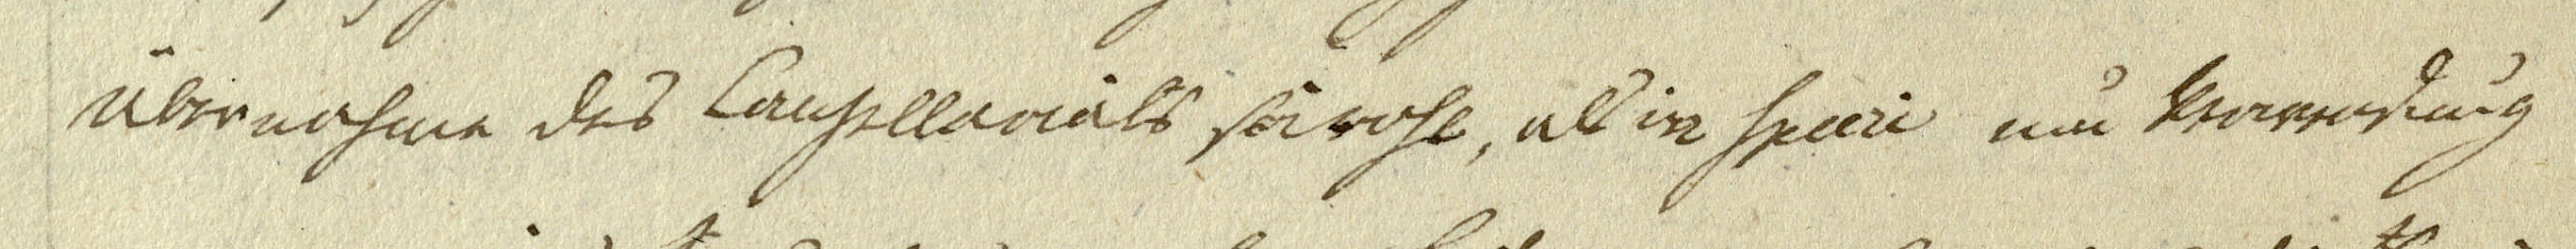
Übernahme des Canzellariats sowohl, als in specie um Verwendung
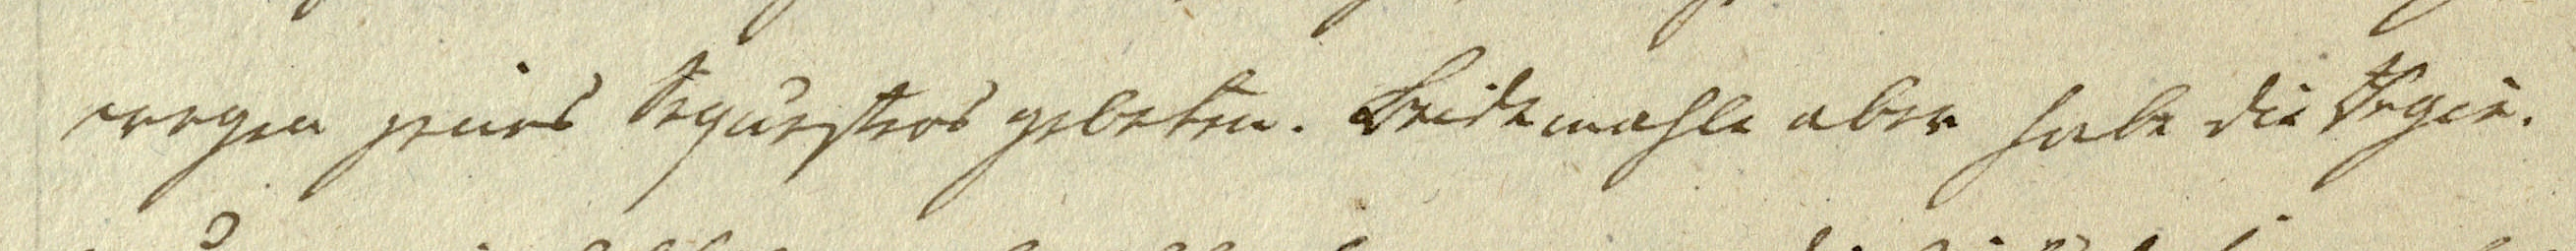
wegen jene Sequesters gebethen. Beidemahle aber habe die Regie¬
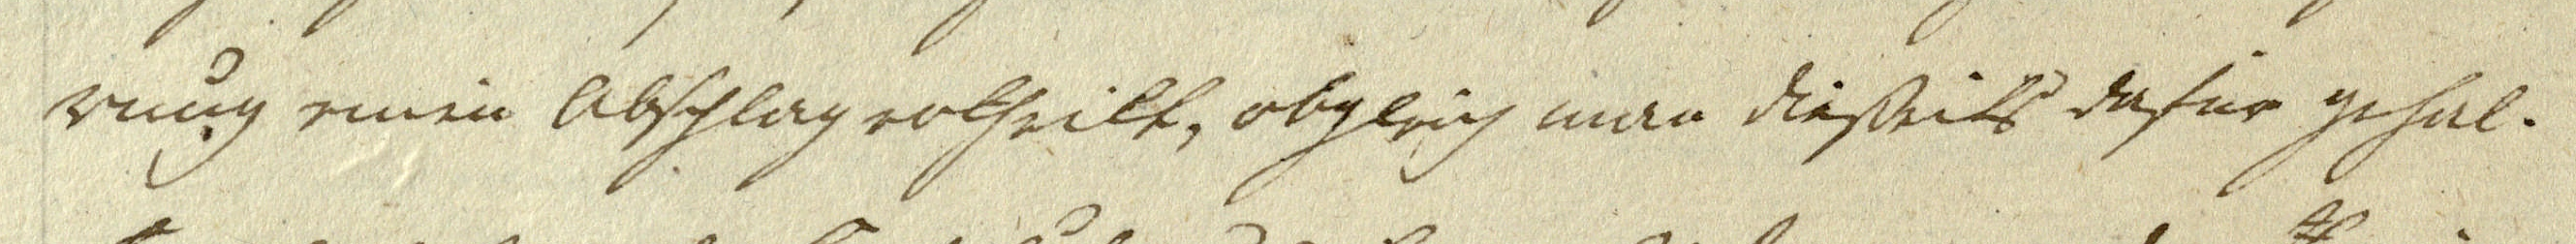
rung einen Abschlag ertheilt, obgleich man dieseits dafür gehal¬
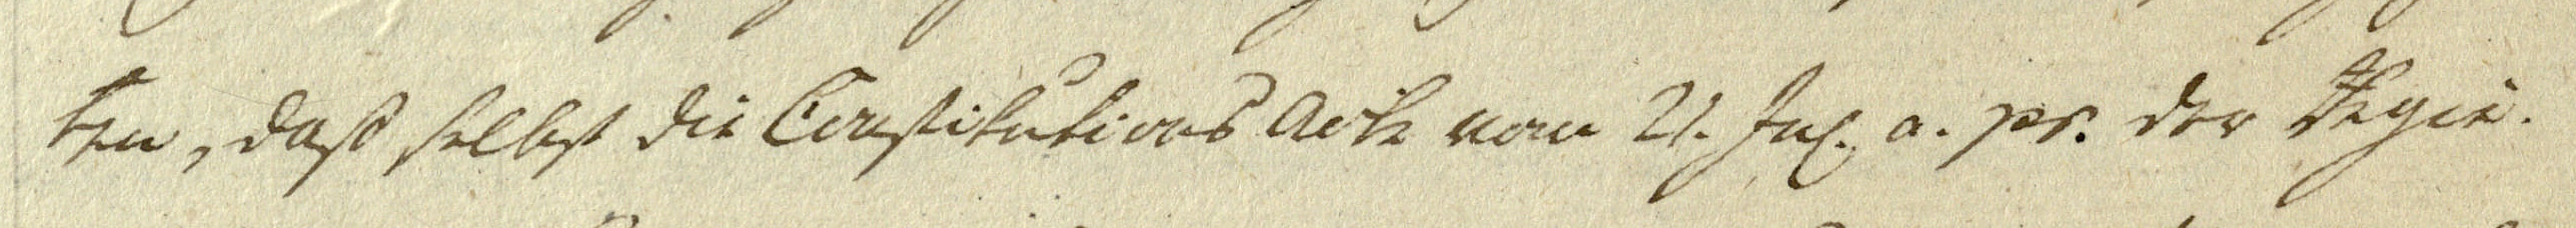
ten, daß selbst die Constitutions Acte vom 21. Jul. a. pr. der Regie¬
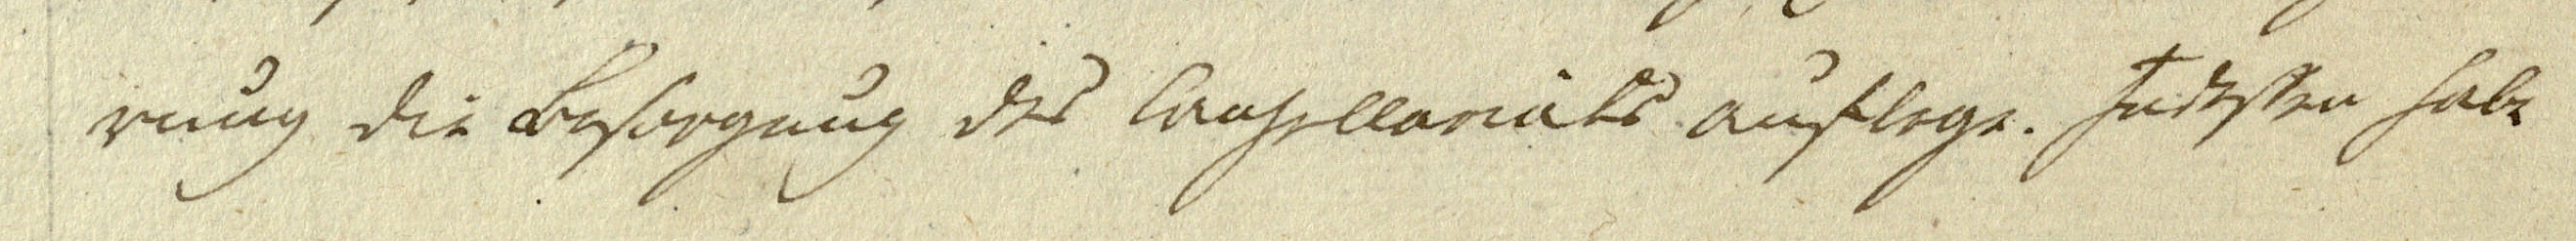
rung die Besorgung des Cazellariats auflege. Indessen habe
